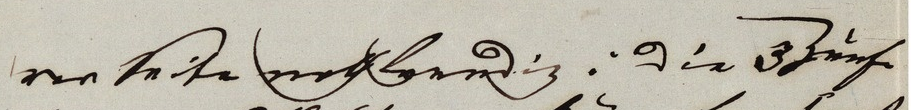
rer Seite nothwendig: Die 3 Zünf-
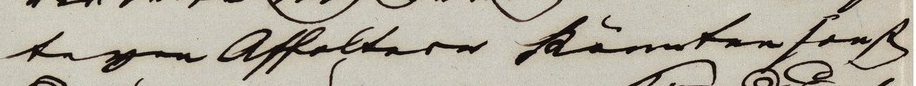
te von Affoltern könnten sonst
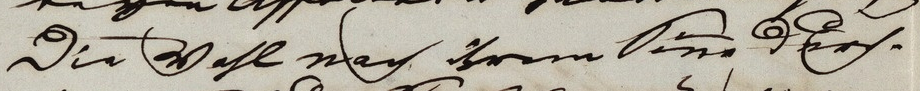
die Wahl nach ihrem Sinne durch-
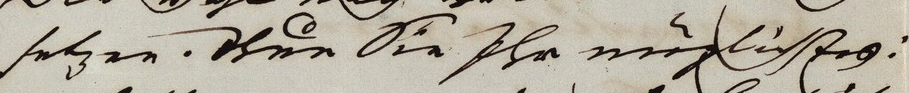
setzen. Thun Sie Ihr möglichstes:
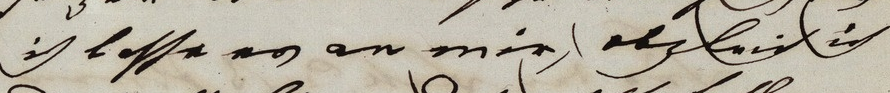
ich lasse es an mir, obgleich ich
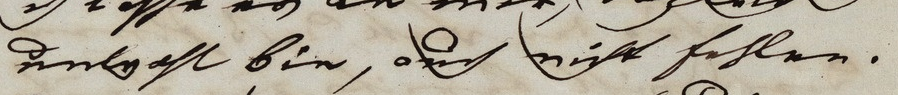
unwohl bin, auch nicht fehlen.
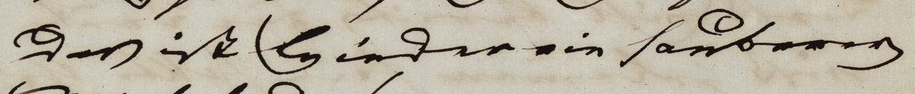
Das ist wieder ein sauberer
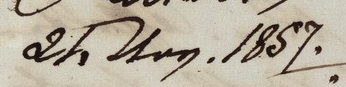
21. Nov. 1857.
